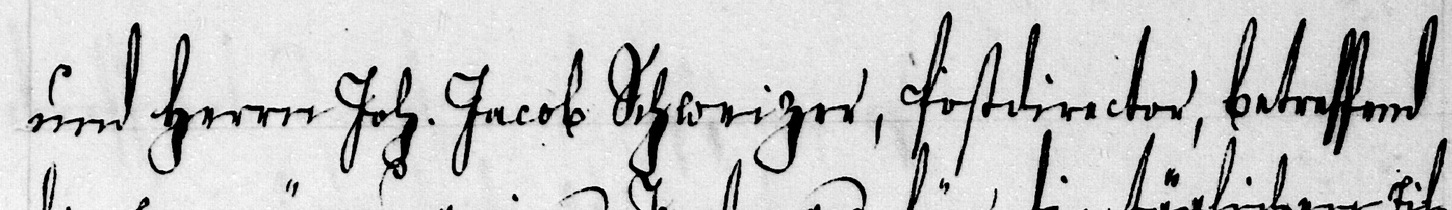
und Herrn Joh. Jacob Schweizer, Postdirector,
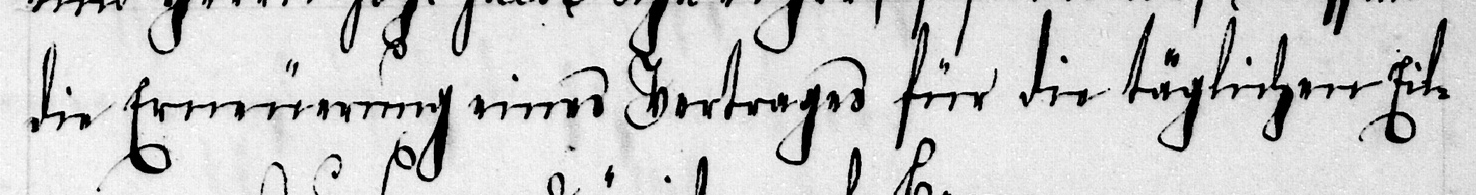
die Erneuerung eines Vertrages für die täglichen Eil¬
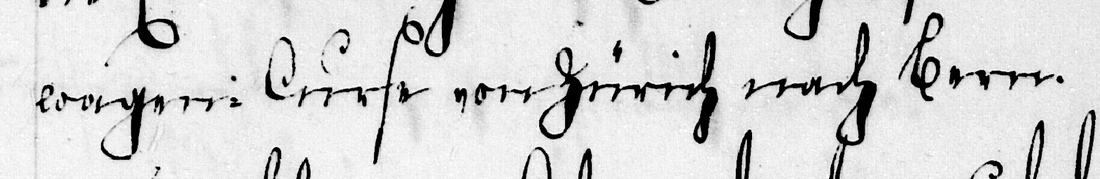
wagen-Curse von Zürich nach Bern.
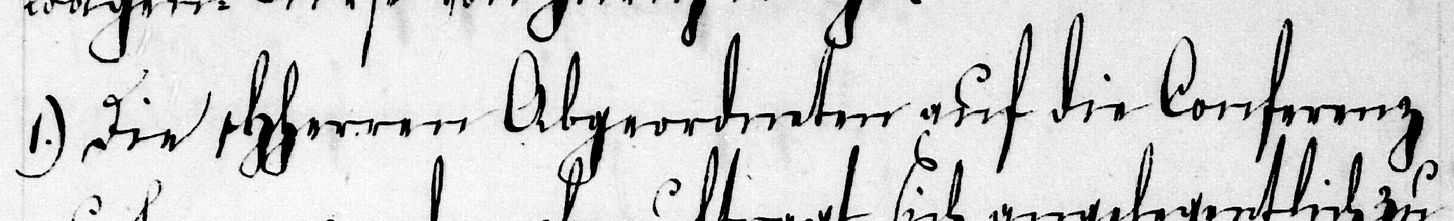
1.) Die HHerren Abgeordneten auf die Conferenz
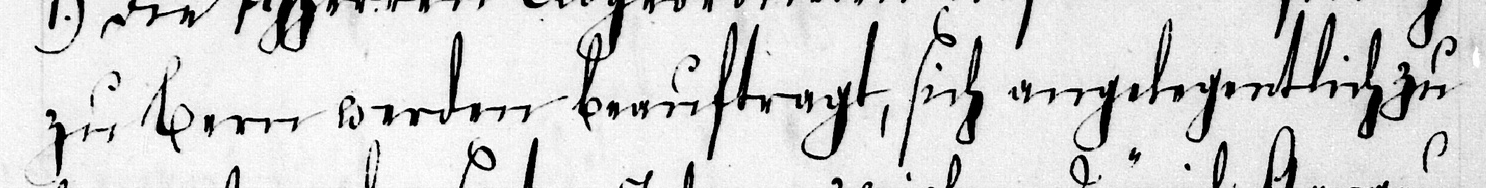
zu Bern werden beauftragt, sich angelegentlich zu
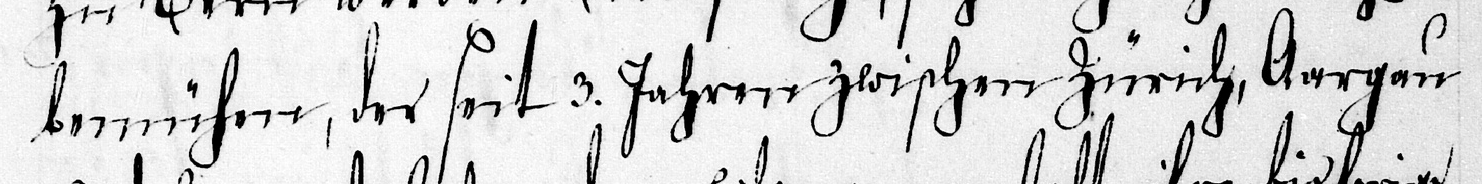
bemühen, der seit 3. Jahren zwischen Zürich, Aargau
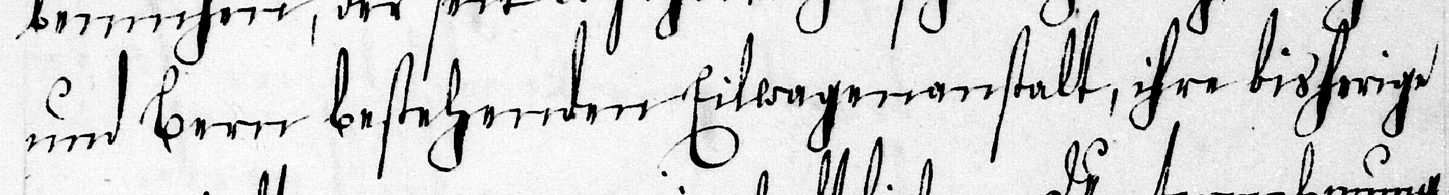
und Bern bestehenden Eilwagenanstalt, ihre bisherige
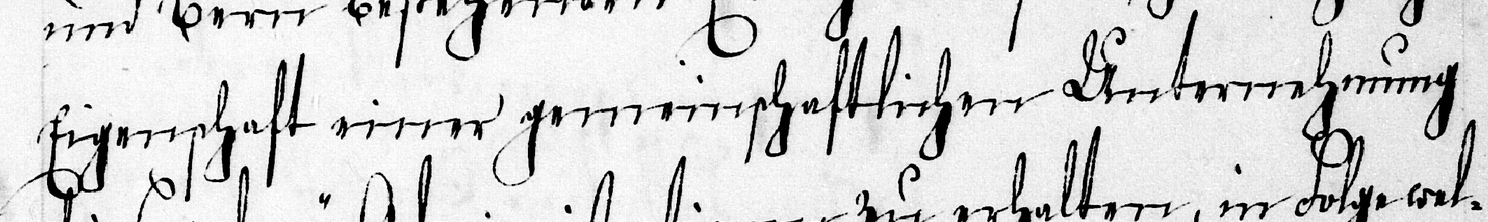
Eigenschaft einer gemeinschaftlichen Unternehmung
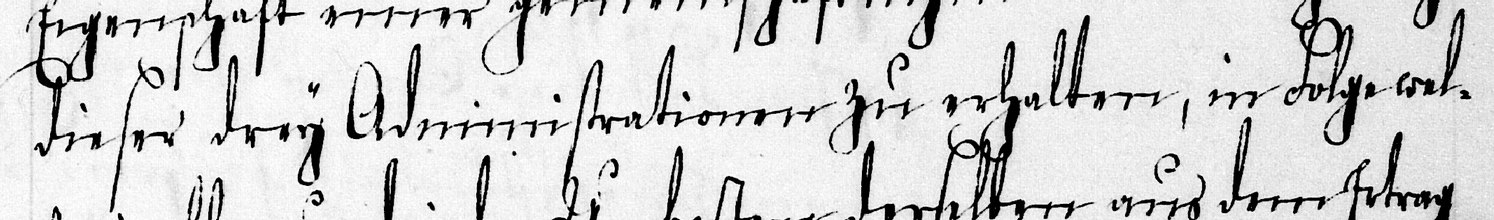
dieser drey Administrationen zu erhalten, in Folge wel¬
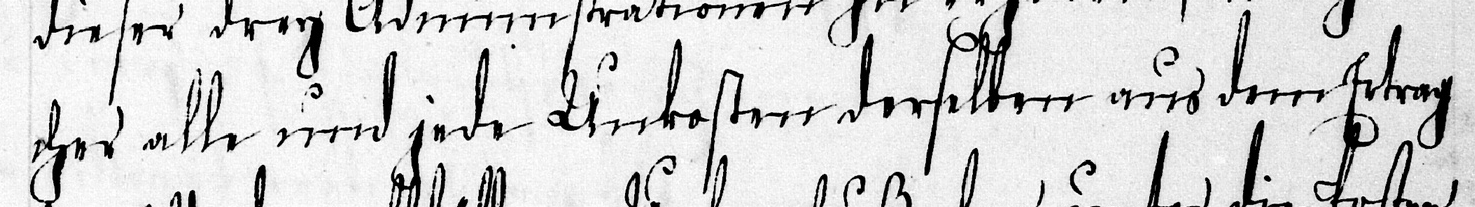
cher alle und jede Unkosten derselben aus dem Ertrag
